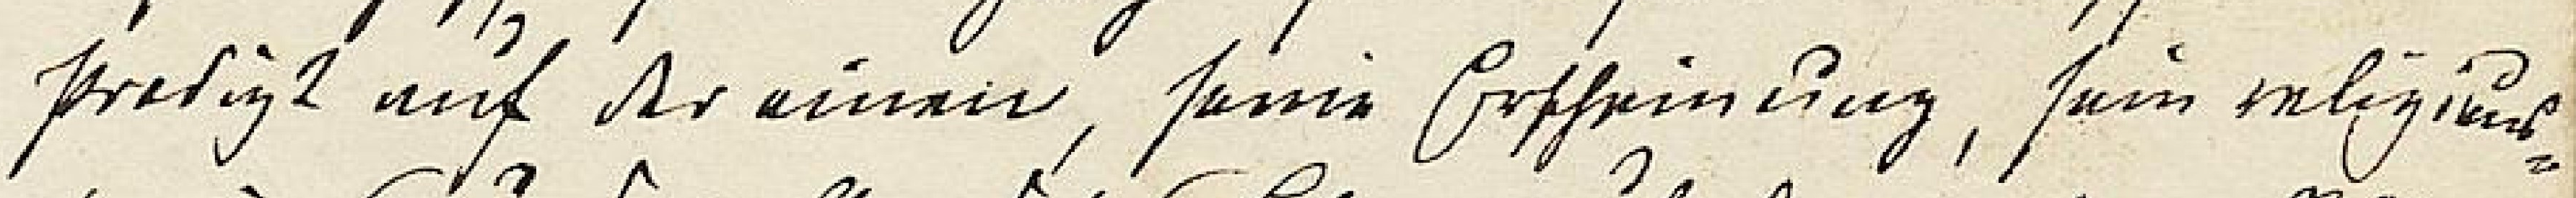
Predigt auf der einen, seine Erscheinung, sein religieus
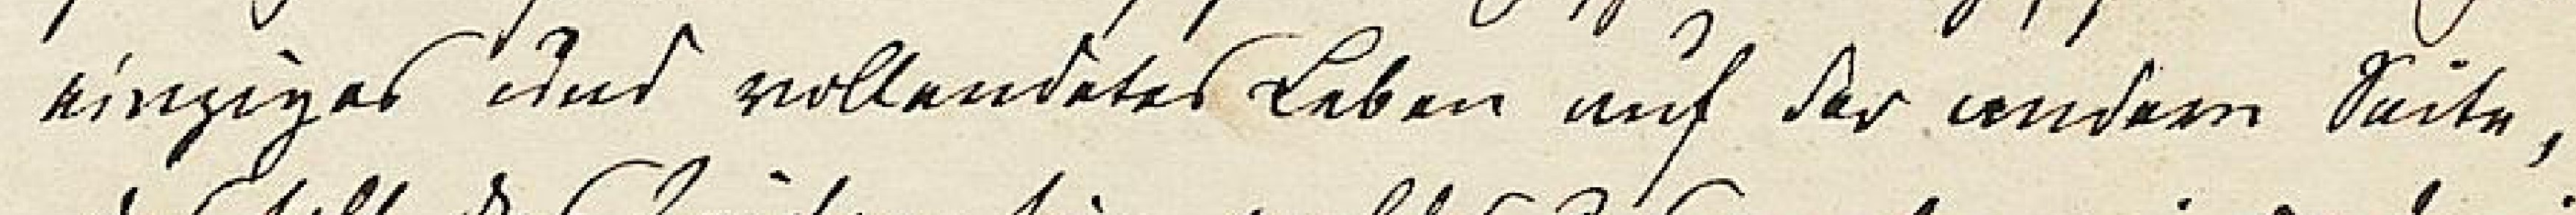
einziges und vollendetes Leben auf der andern Seite,
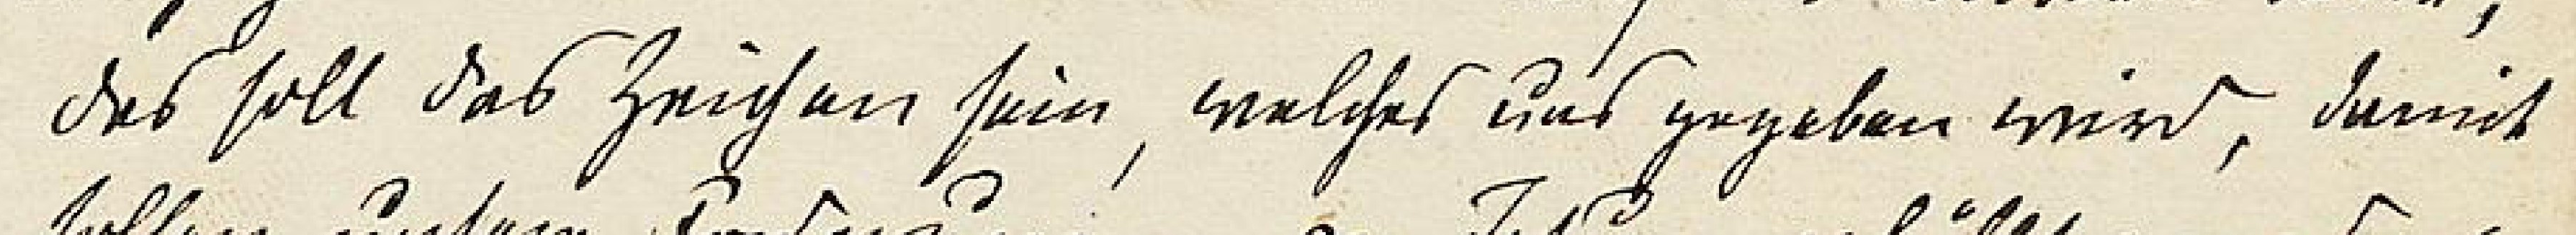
das soll das Zeichen sein, welches uns gegeben wird, damit
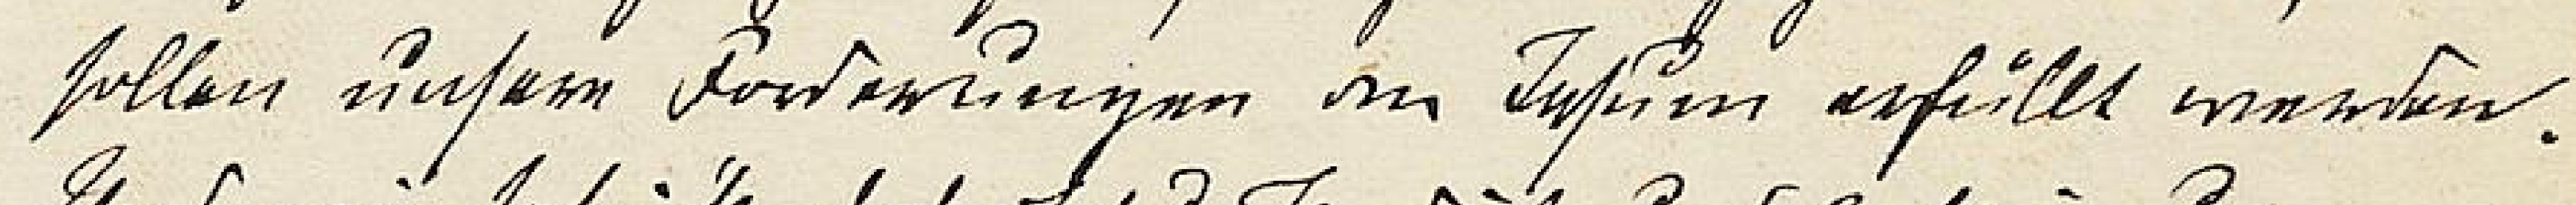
sollen unsere Forderungen an Jesum erfüllt werden.
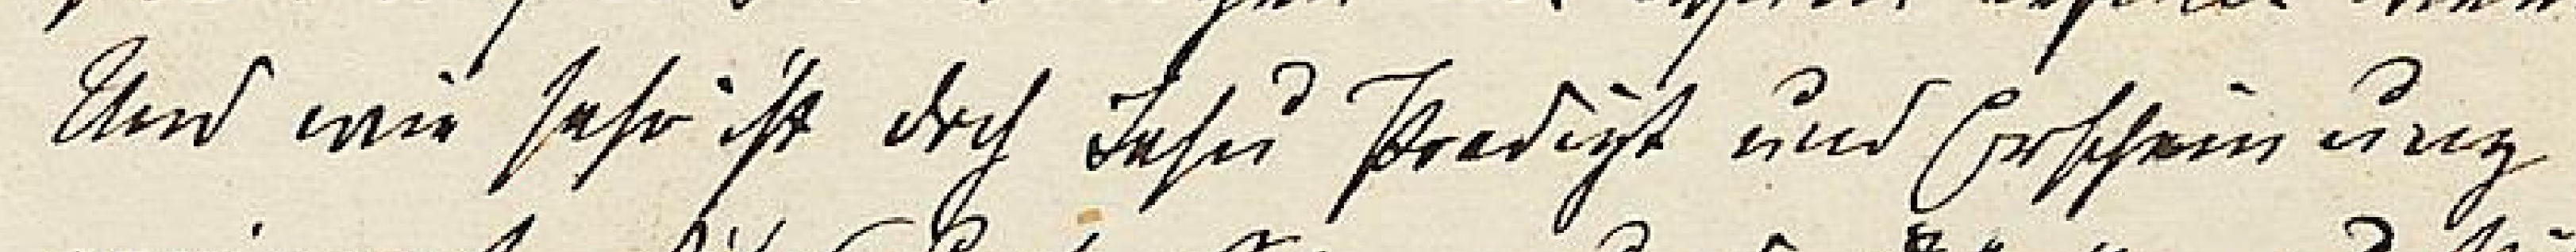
Und wie sehr ist doch Jesu Predigt und Erscheinung
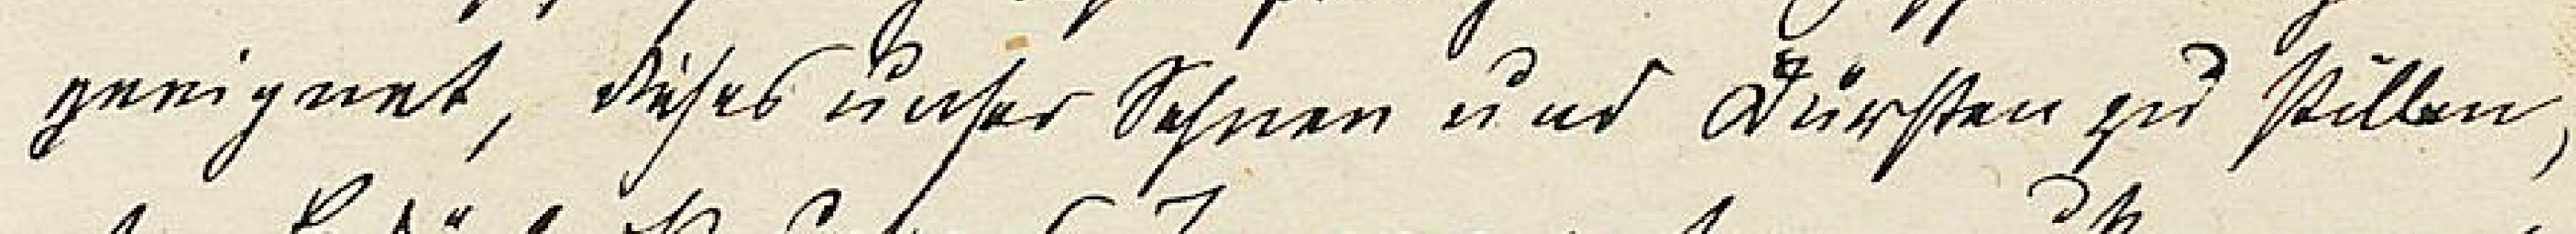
geeignet, dieses unser Sehnen und Dürsten zu stillen,
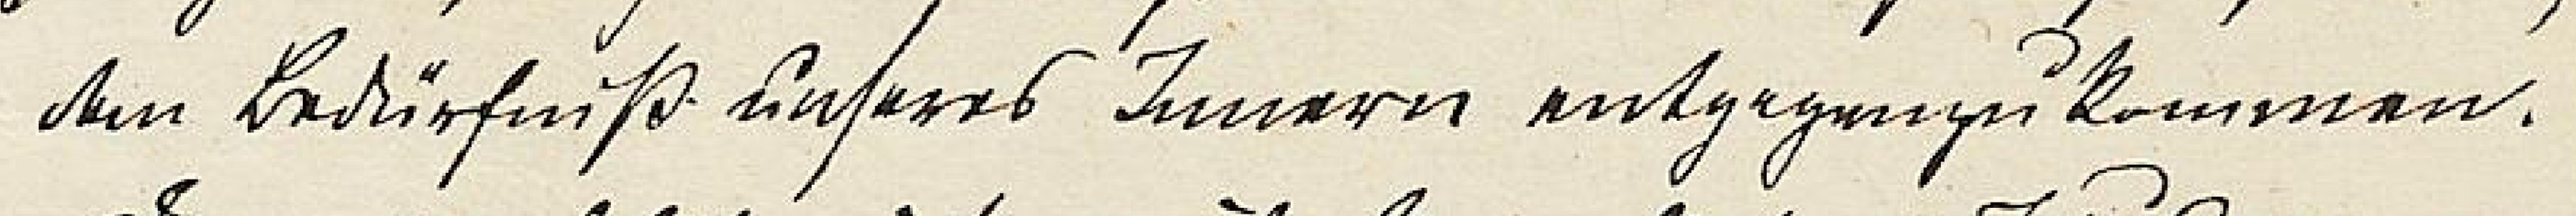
dem Bedürfnis unseres Innern entgegenzukommen.
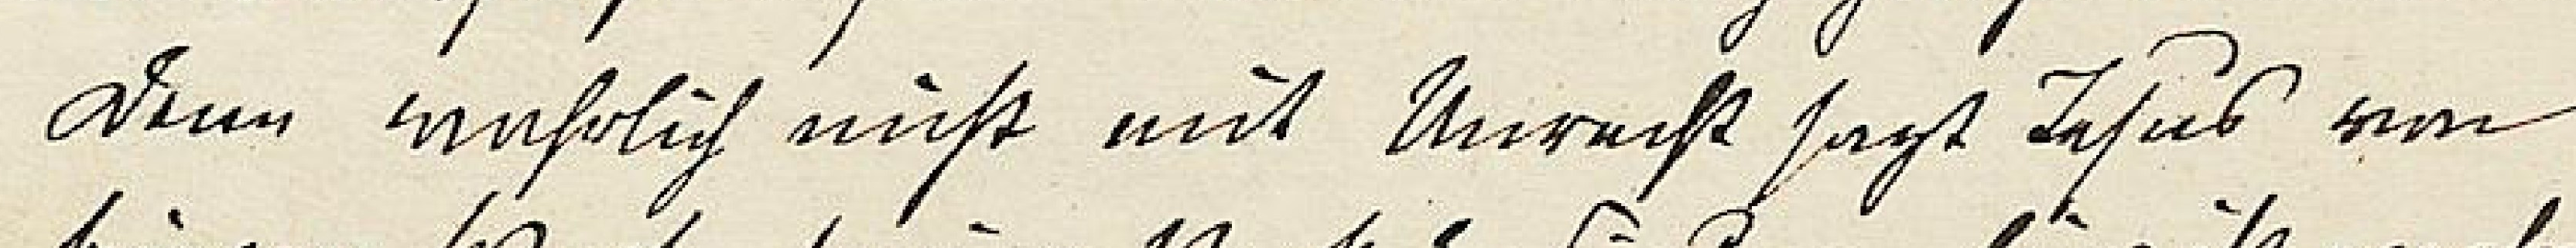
Denn wahrlich nicht mit Unrecht saig Jesus von
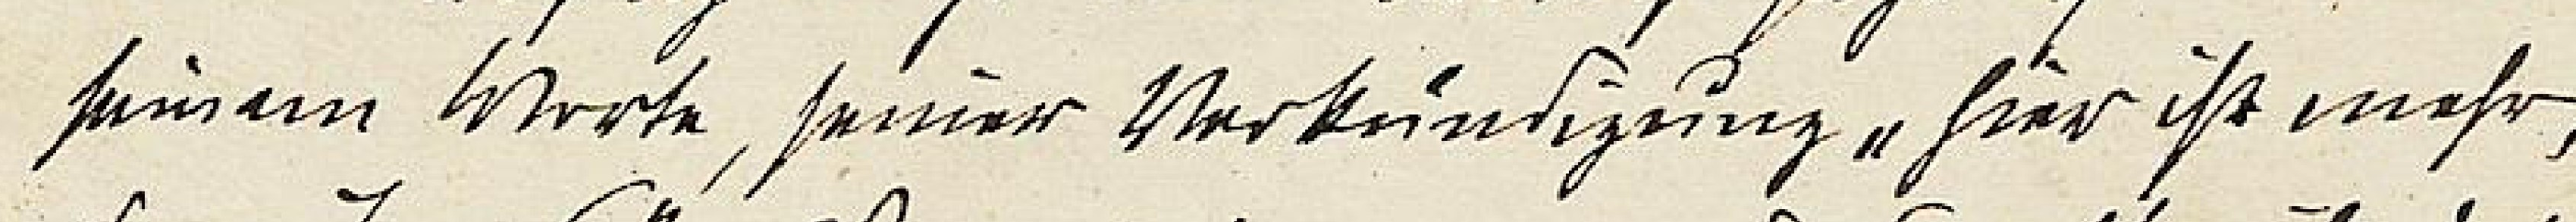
seinem Worte, seiner Verkündigung "hier ist mehr,
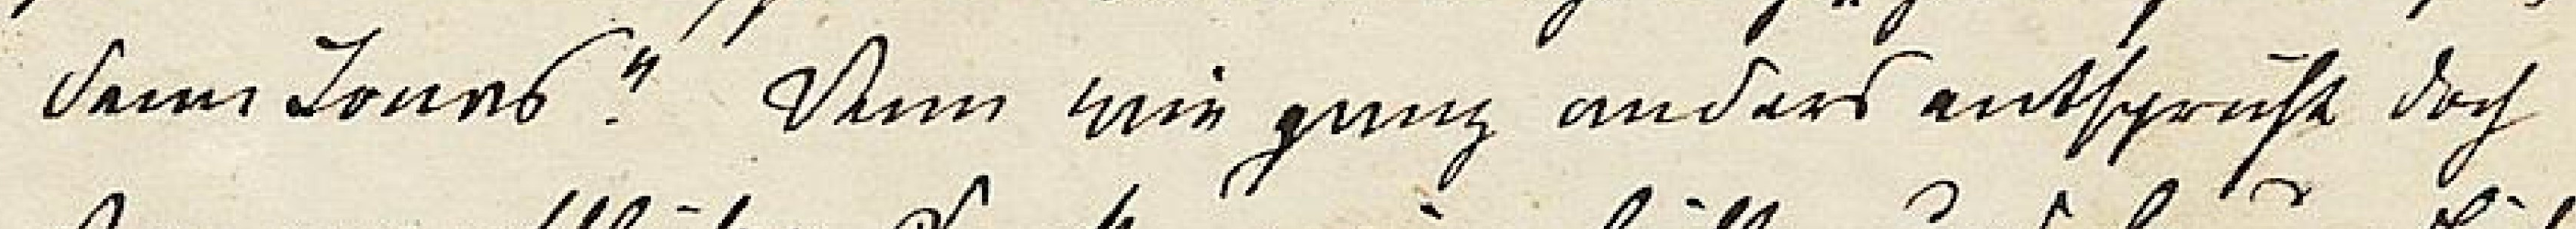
denn Jonas." Denn wie ganz anders entspricht doch
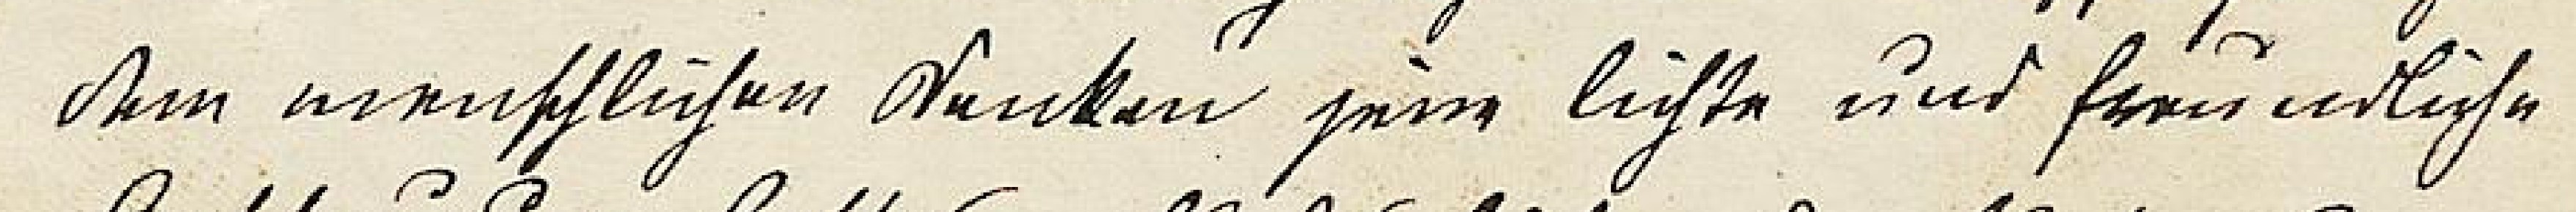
dem menschlichen Denken jene lichte und freundliche
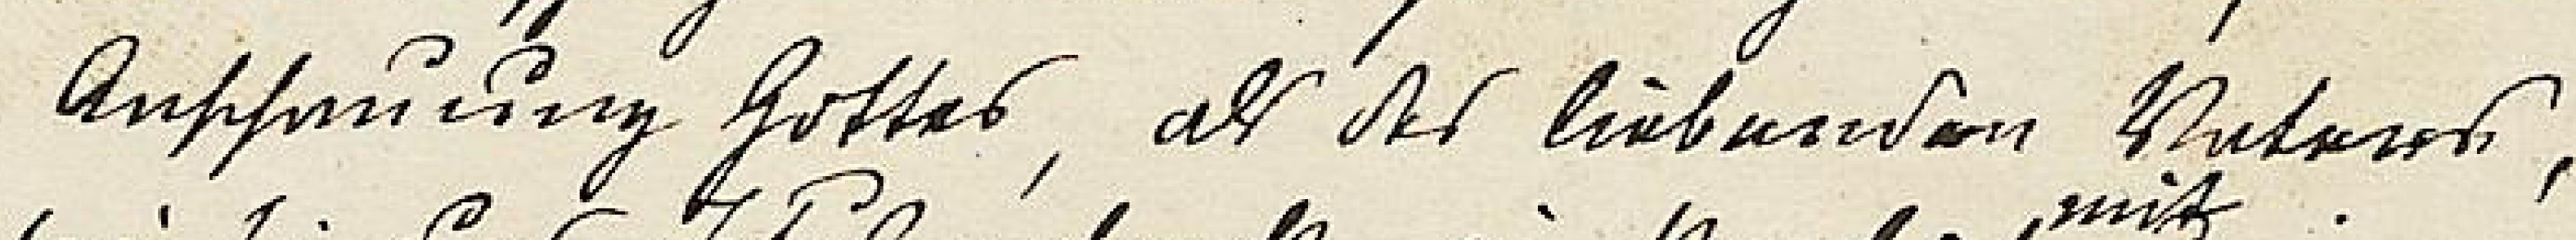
Anschauung Gottes, als des liebenden Vaters,
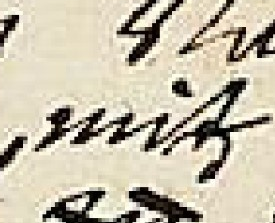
mit
